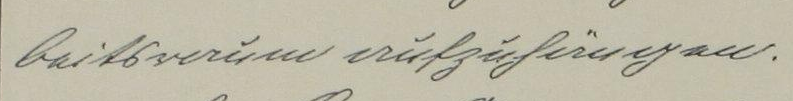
beitsraum aufzuhängen.
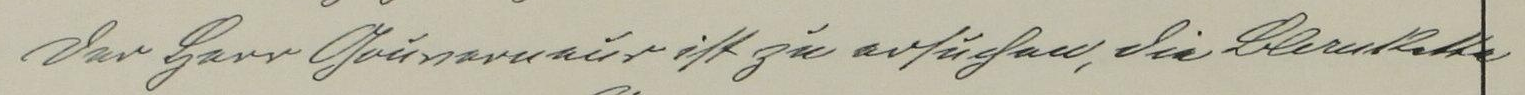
Der Herr Gouverneur ist zu ersuchen, die Blankette
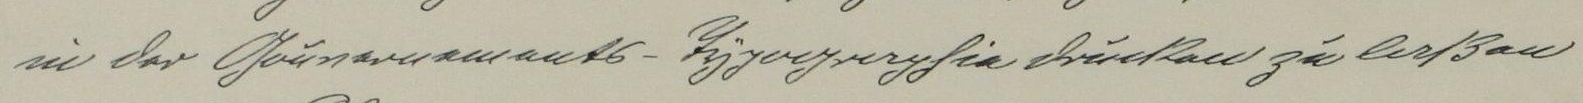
in der Gouvernements-Typographie drucken zu laßen
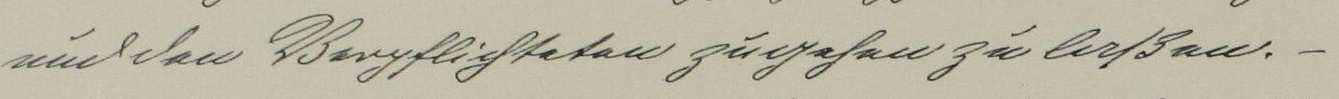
und den Verpflichteten zugehen zu laßen.
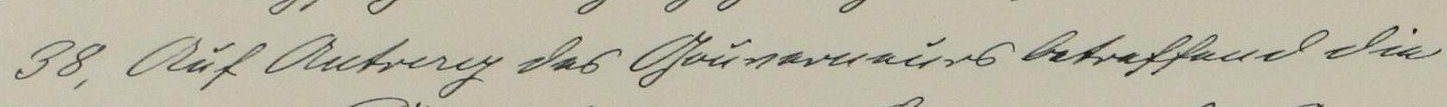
38. Auf Antrag des Gouverneurs betreffend die
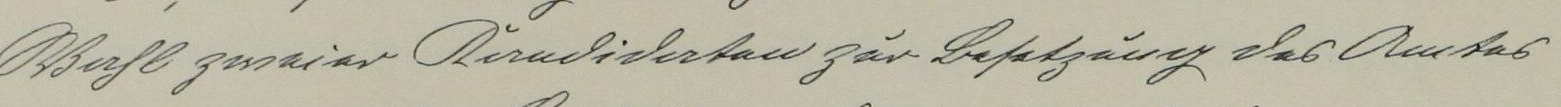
Wahl zweier Kandidaten zur Besetzung des Amtes
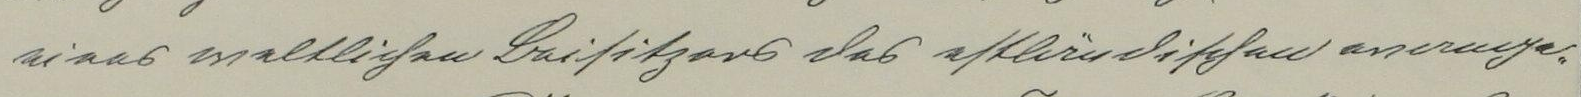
eines weltlichen Beisitzers des estländischen evange-
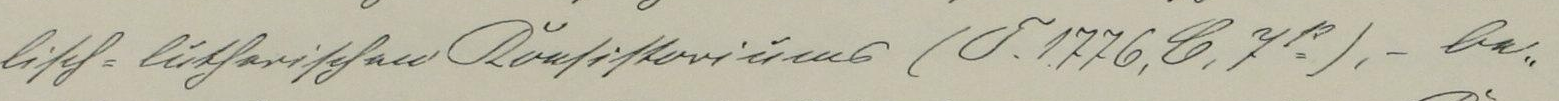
lisch-lutherischen Konsistoriums (T. 1776; C.7p), - be-
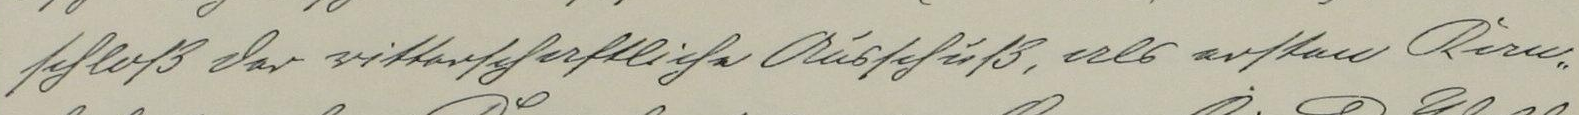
schloß der ritterschaftliche Ausschuß, als ersten Kan-
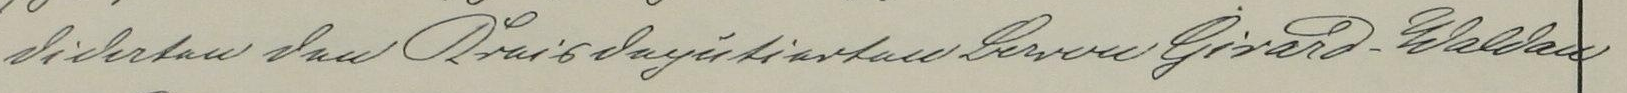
didaten den Kreisdeputierten Baron Girard-Waldau
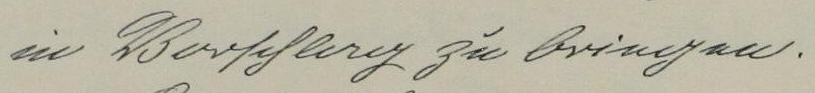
in Vorschlag zu bringen.
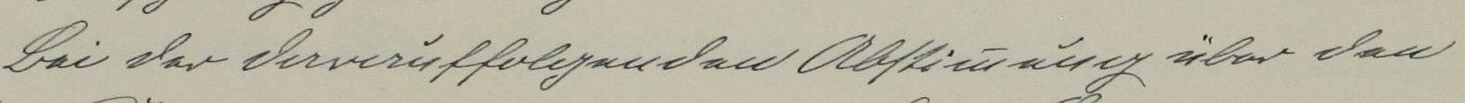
Bei der darauffolgenden Abstimmung über den
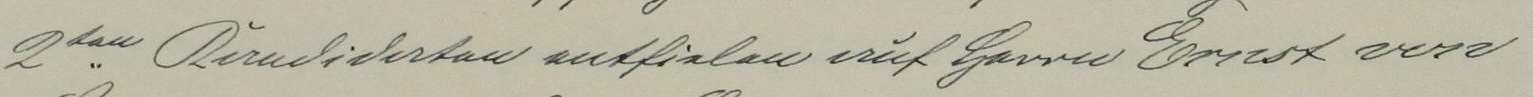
2ten Kandidaten entfielen auf Herrn Ernst von
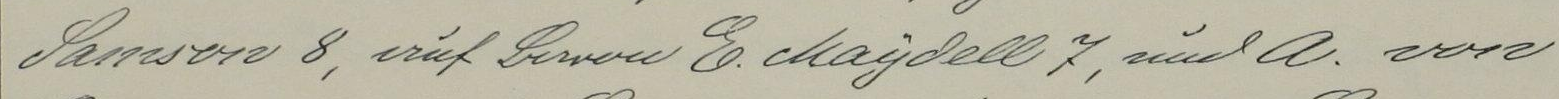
Samson 8, auf Baron E. Maydell 7, und A. von
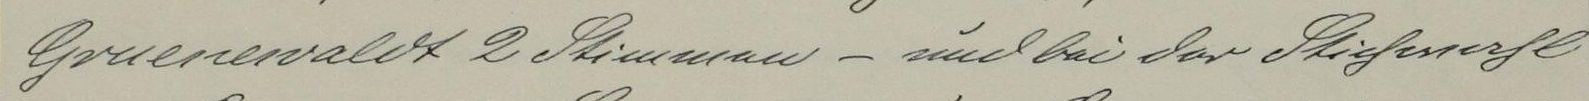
Gruenewaldt 2 Stimmen - und bei der Stichwahl
